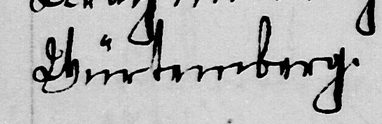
Würtemberg,
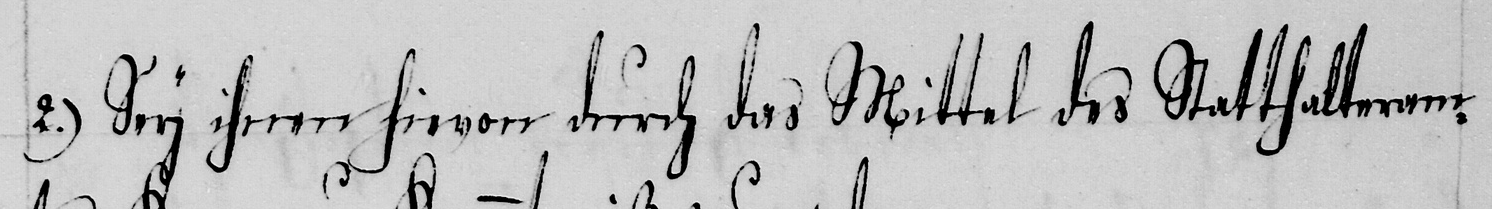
2.) Sey ihnen hievon durch das Mittel des Statthalteram¬
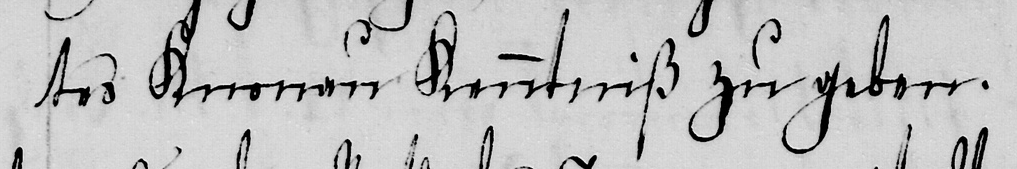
tes Knonau Kenntniß zu geben.
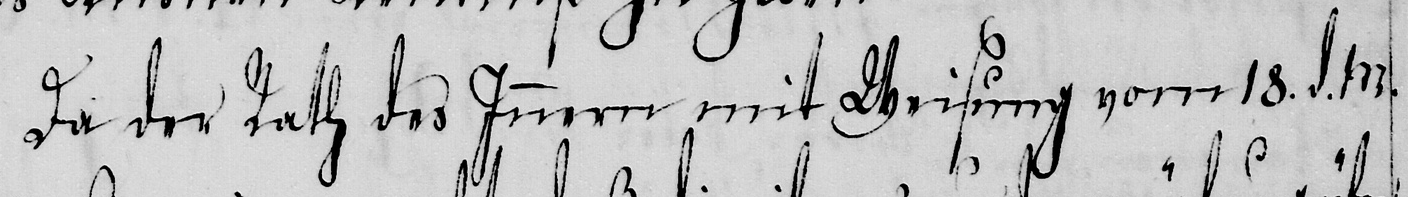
Da der Rath des Innern mit Weisung vom 18. d. M.
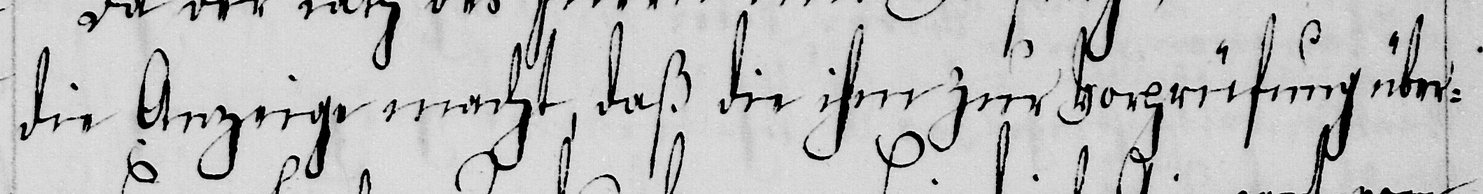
die Anzeige macht, daß die ihm zur Vorprüfung über¬
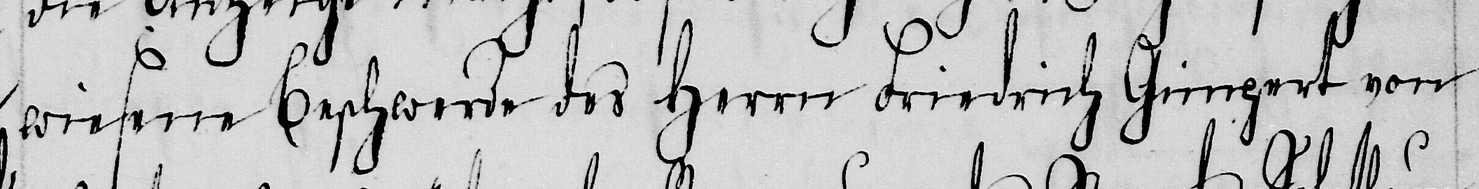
wiesene Beschwerde des Herrn Friedrich Gimpert von
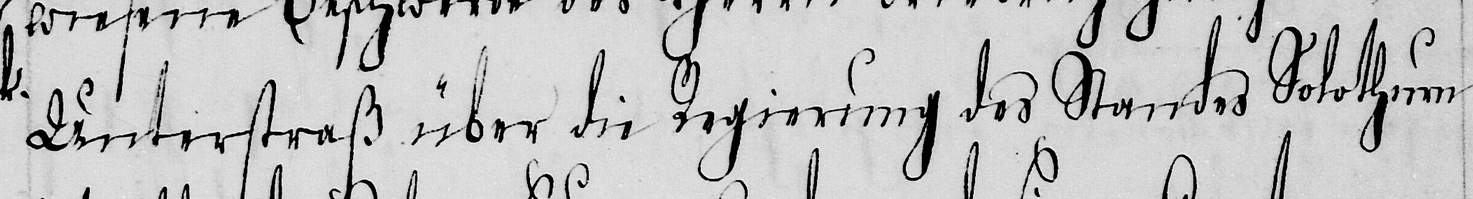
Unterstraß über die Regierung des Standes Solothurn
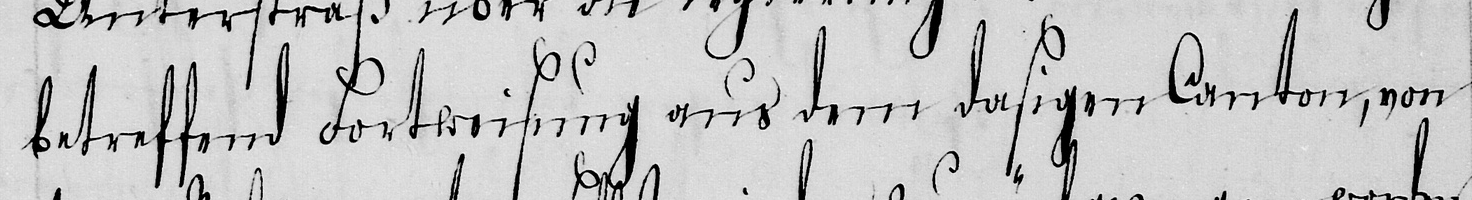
betreffend Fortweisung aus dem dasigen Canton, von
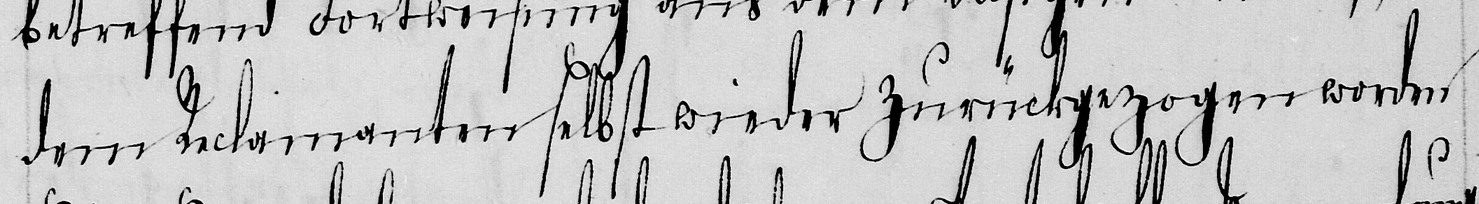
dem Reclamanten selbst wieder zurückgezogen worden
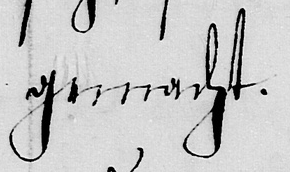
gemacht.
